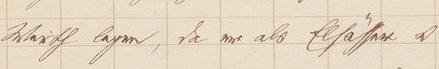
Werth legen, da er als Elsässer & mir
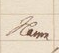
einem
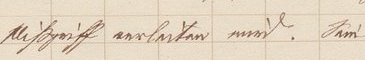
Mißgriff verleiten wird. Sein
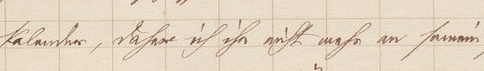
kalender, daher ich ihn nicht mehr an seinem
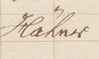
Posten
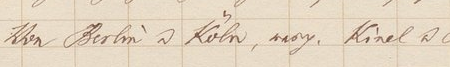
Von Berlin & Köln, resp. Kinel &
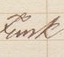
dieser
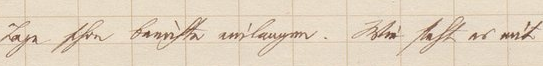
Tage schon Berichte einlangen. Wie steht er mit
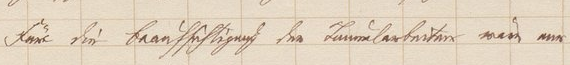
Für die Beaufsichtigung der Tunnelarbeiten wäre mir
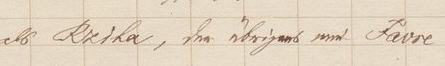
als Rzika, der übrigens wie Favre
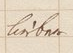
behauptet
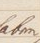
einzigen
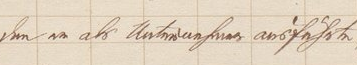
den er als Unternehmer ausführte,
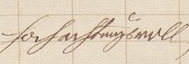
Hochachtungsvoll,
